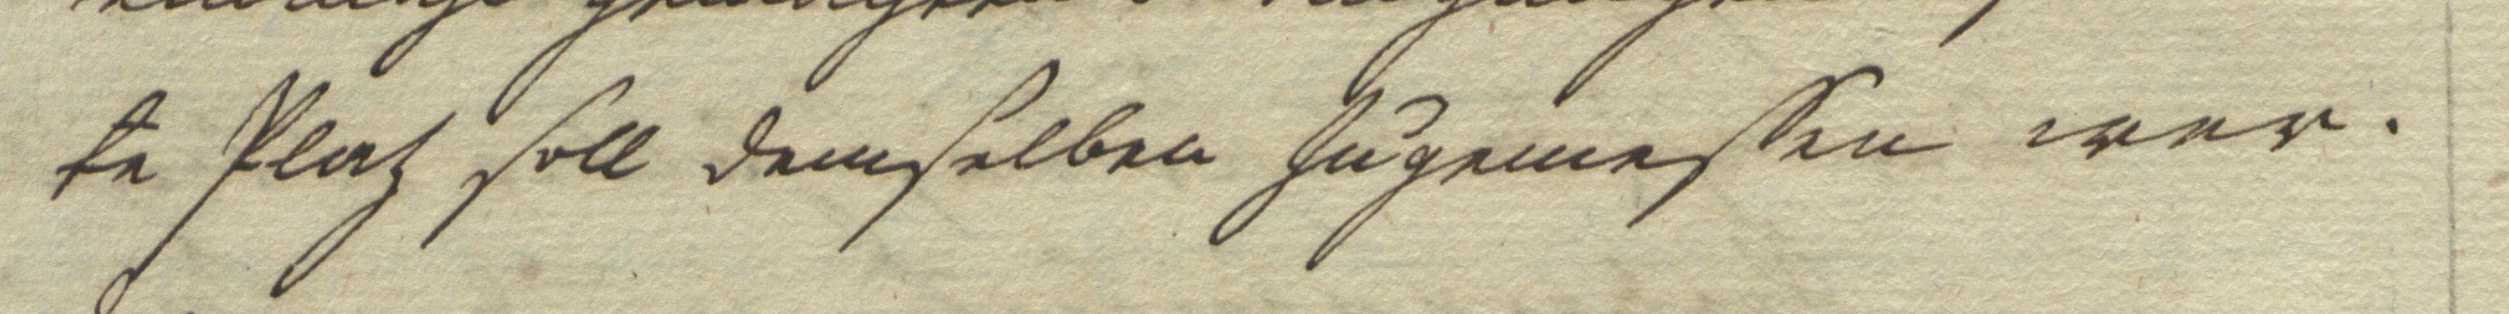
te Platz soll demselben zugemessen wer¬
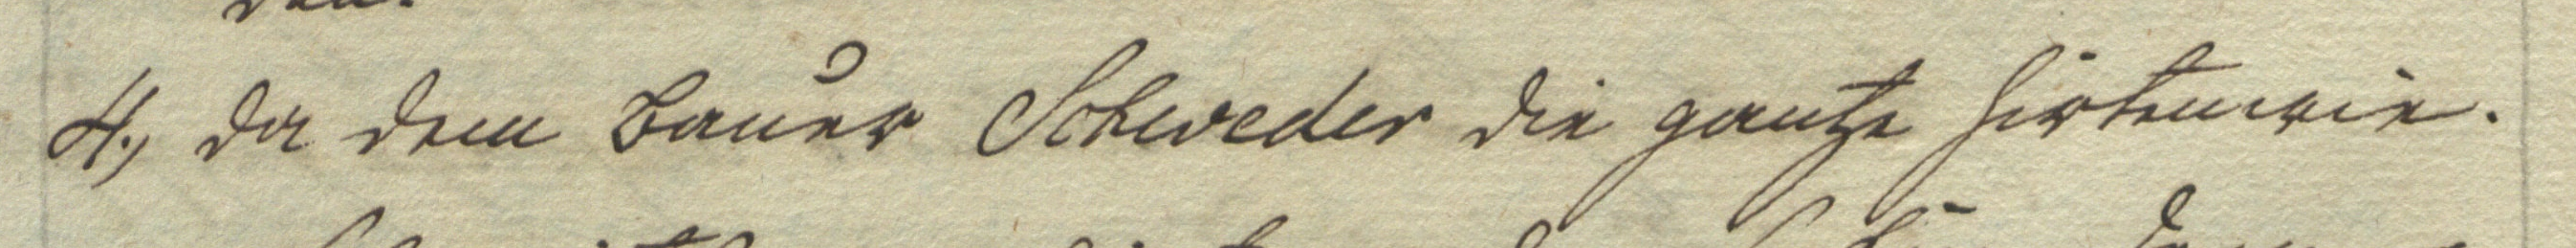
4., Da dem Bauer Schweder die gantze Hirtenwie¬
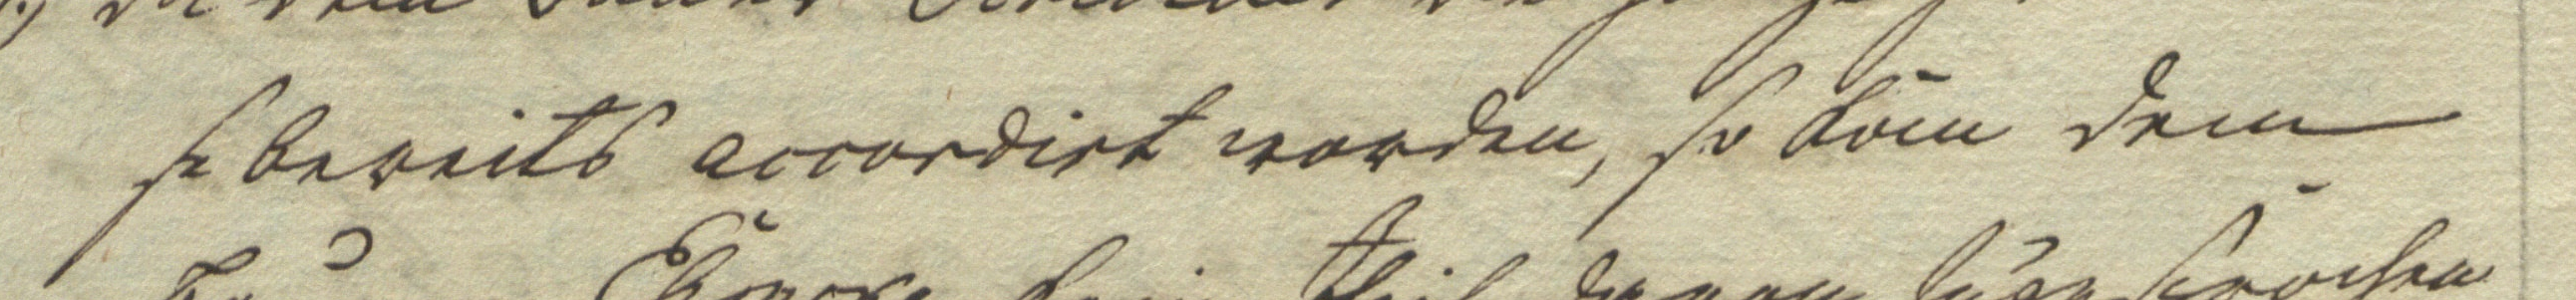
se bereits accordirt worden, so kan dem
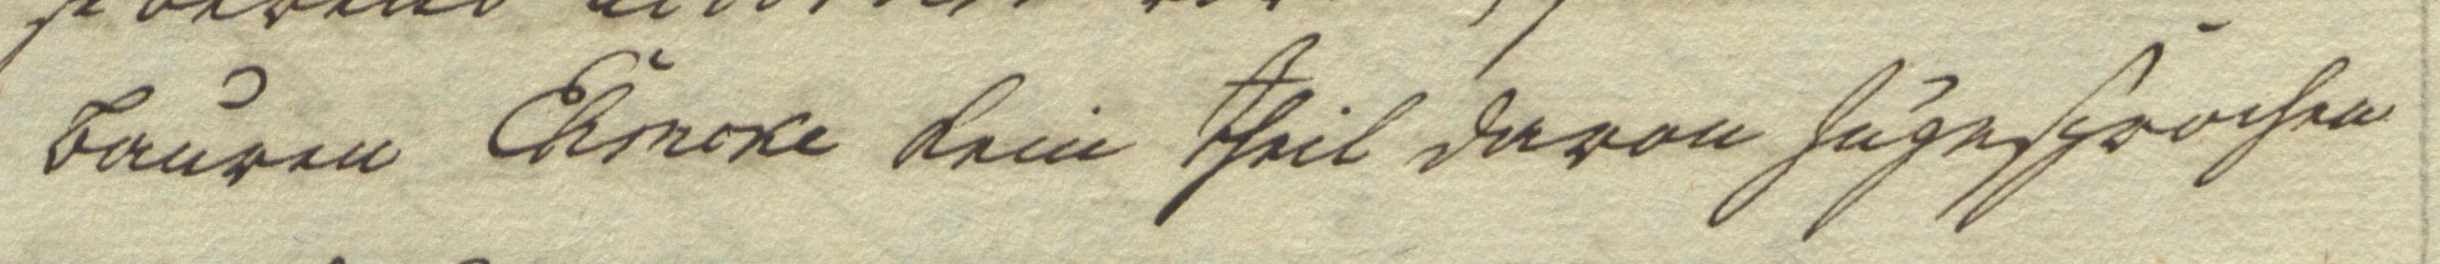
Bauren Ehmcke kein Theil davon zugesprochen
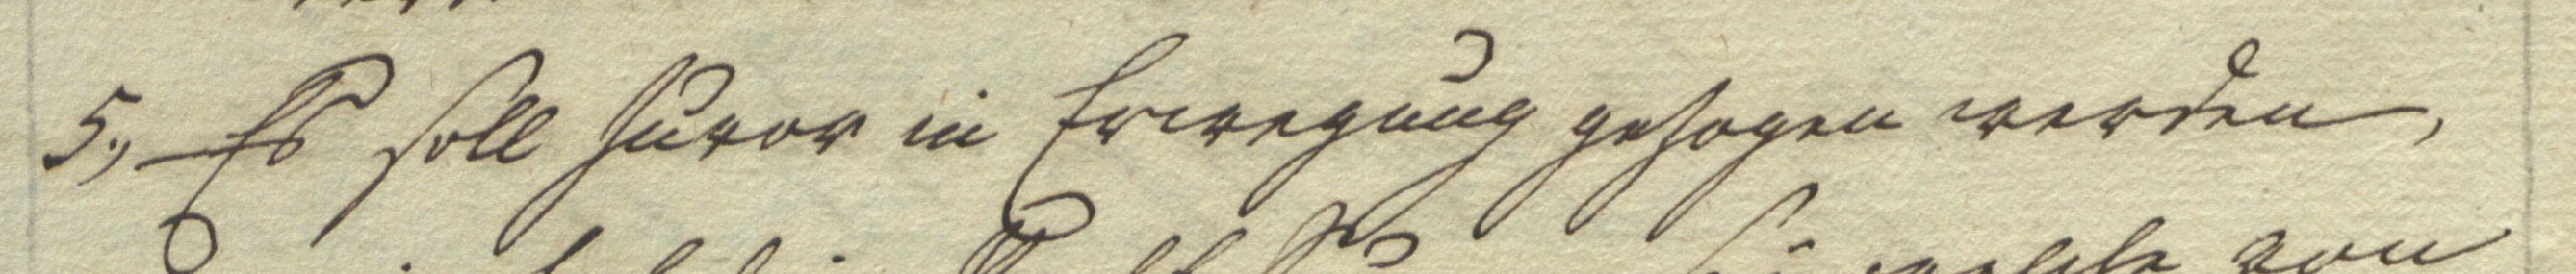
5., Es soll zuvor in Erwegung gezogen werden,
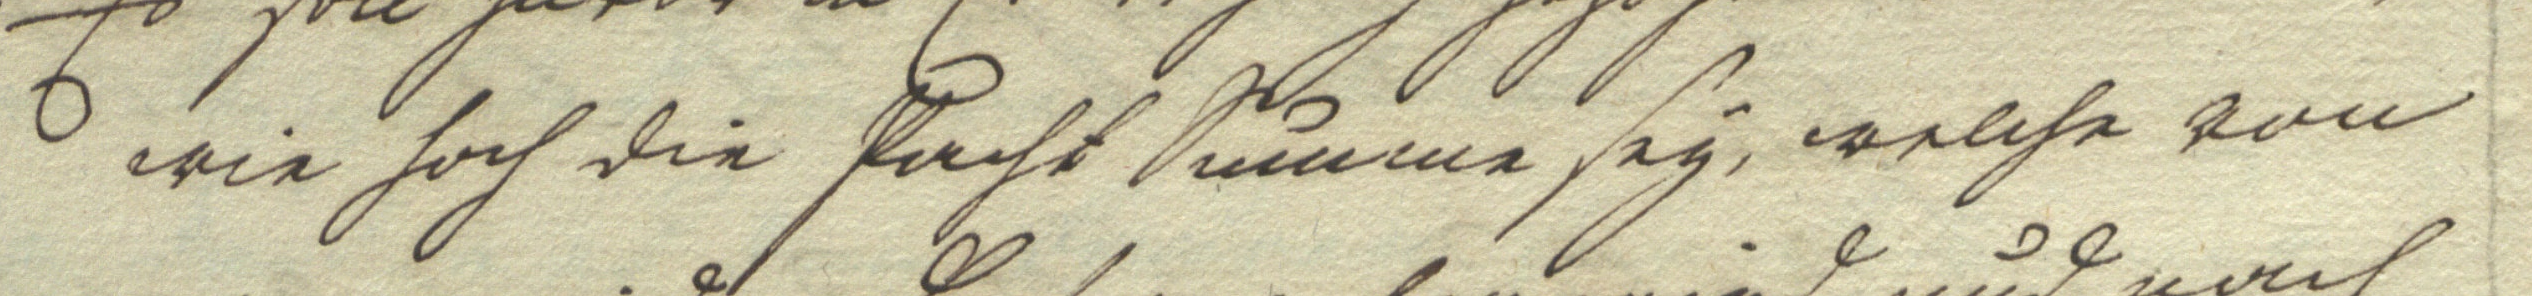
wie hoch die Pacht Summe seÿ, welche von
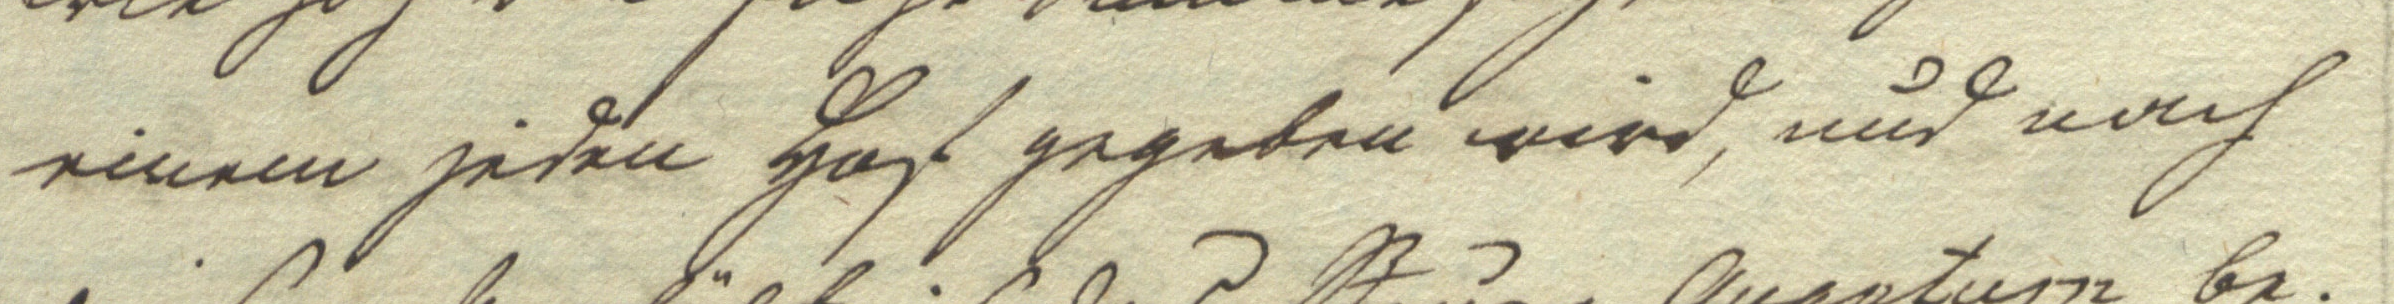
einem jeden Hof gegeben wird, und nach
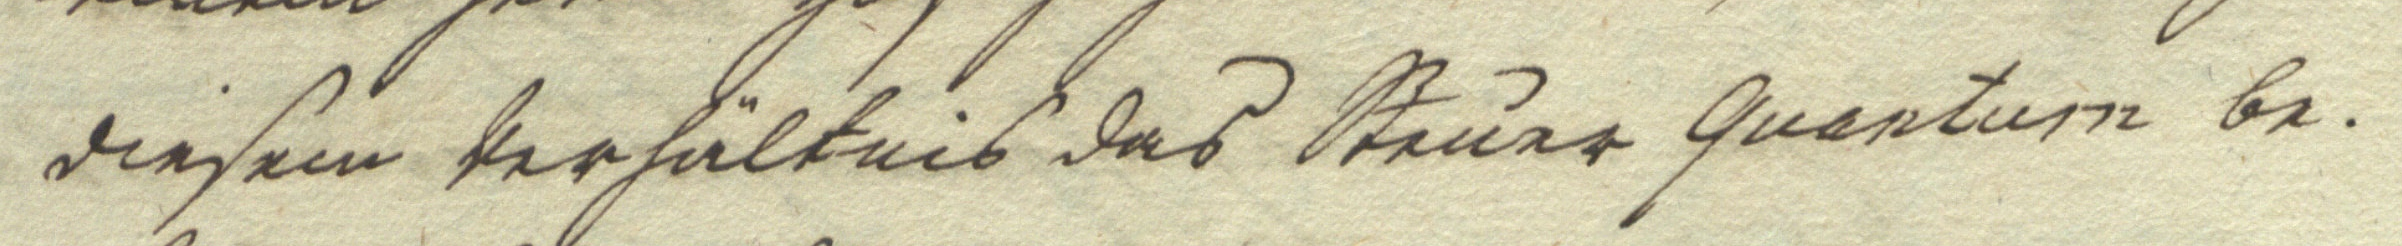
diesem Verhältnis das Steuer Quantum be¬
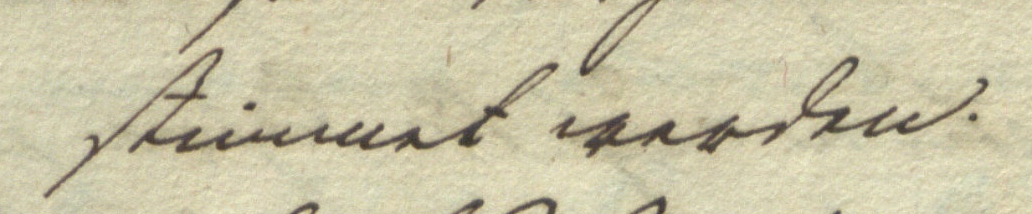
stimmet werden.
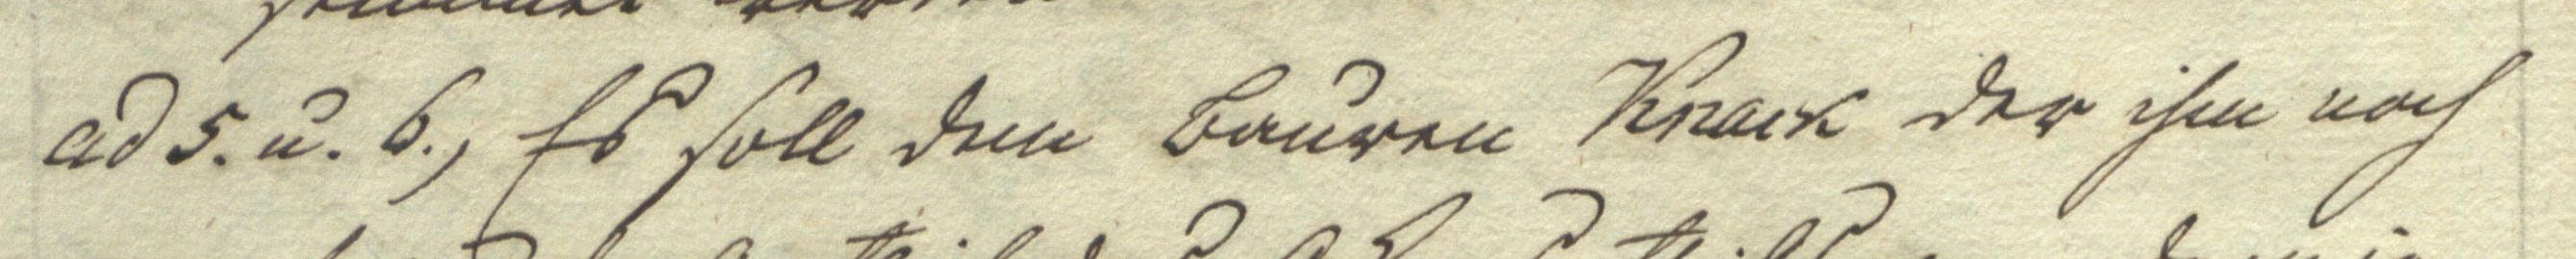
ad 5. u. 6., Es soll dem Bauren Knack der ihm noch
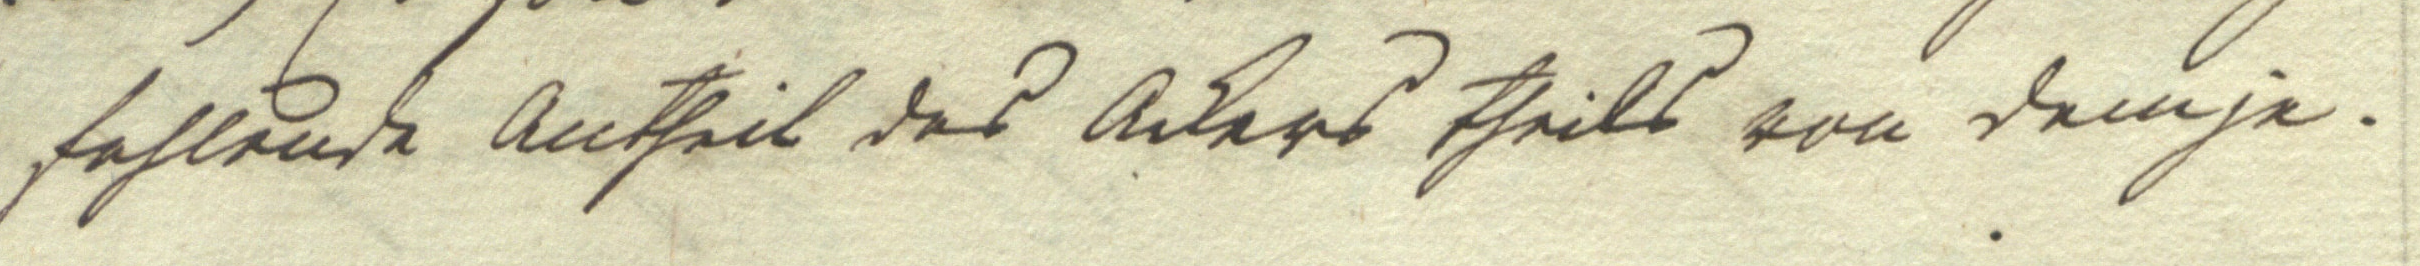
fehlende Antheil des Ackers theils von demje¬
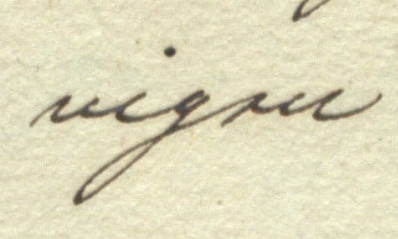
nigen
